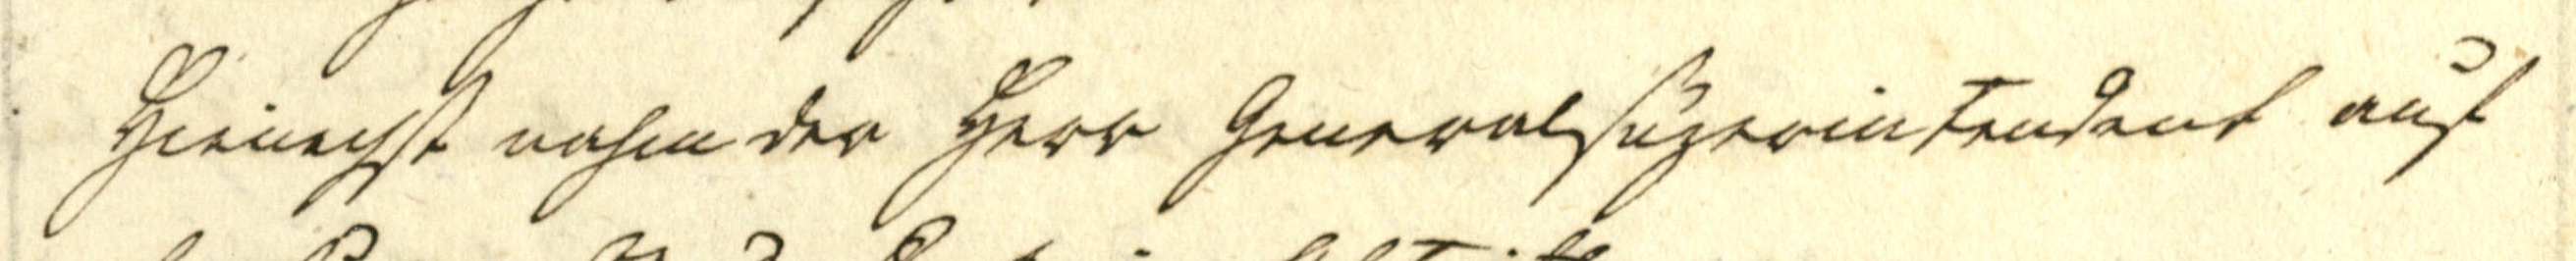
Hienechst nahm der Herr Generalsuperintendent auf
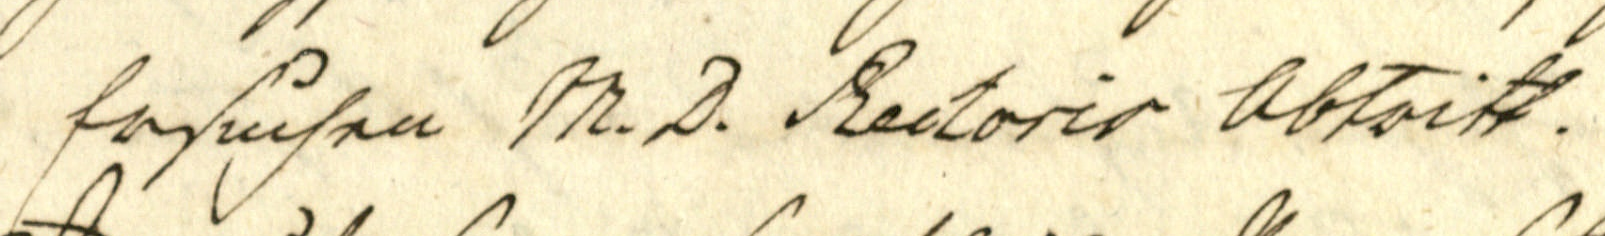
Ersuchen M. D. Rectoris Abtritt.
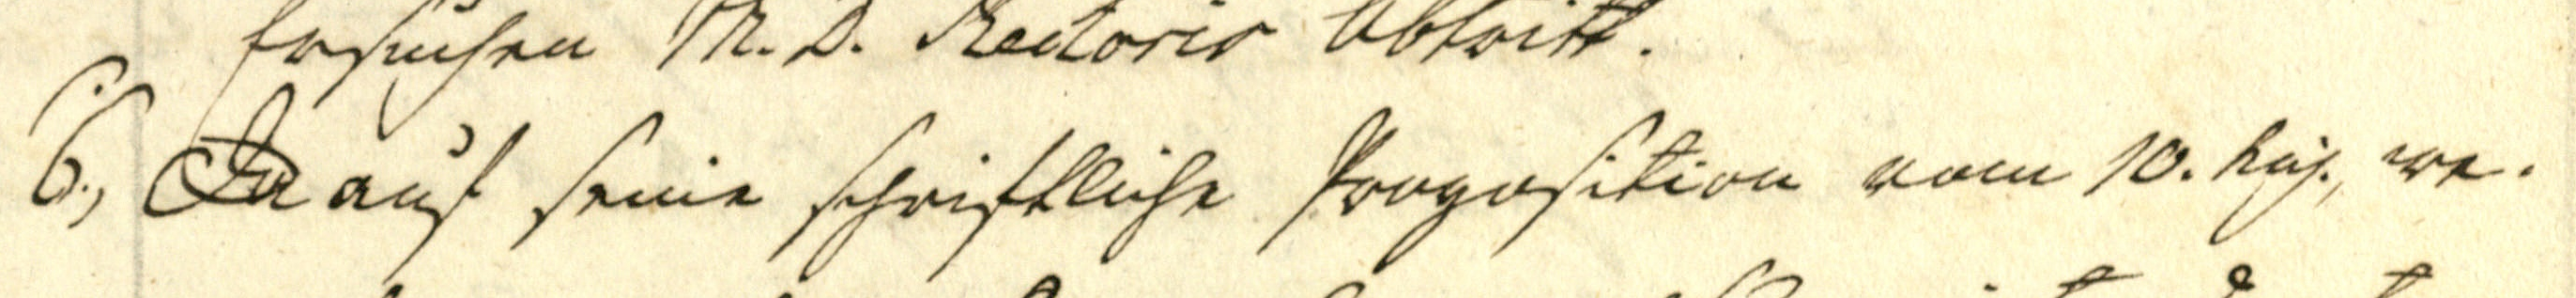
6., Da auf seine schriftliche Proposition vom 10. huj. we¬
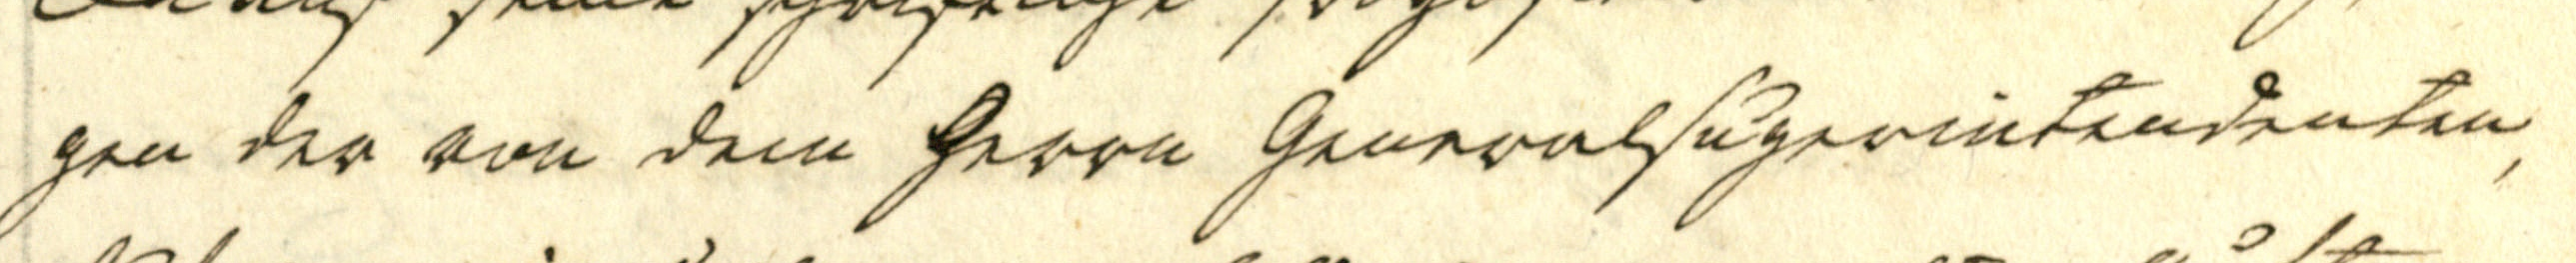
gen der von dem Herrn Generalsuperintendenten,
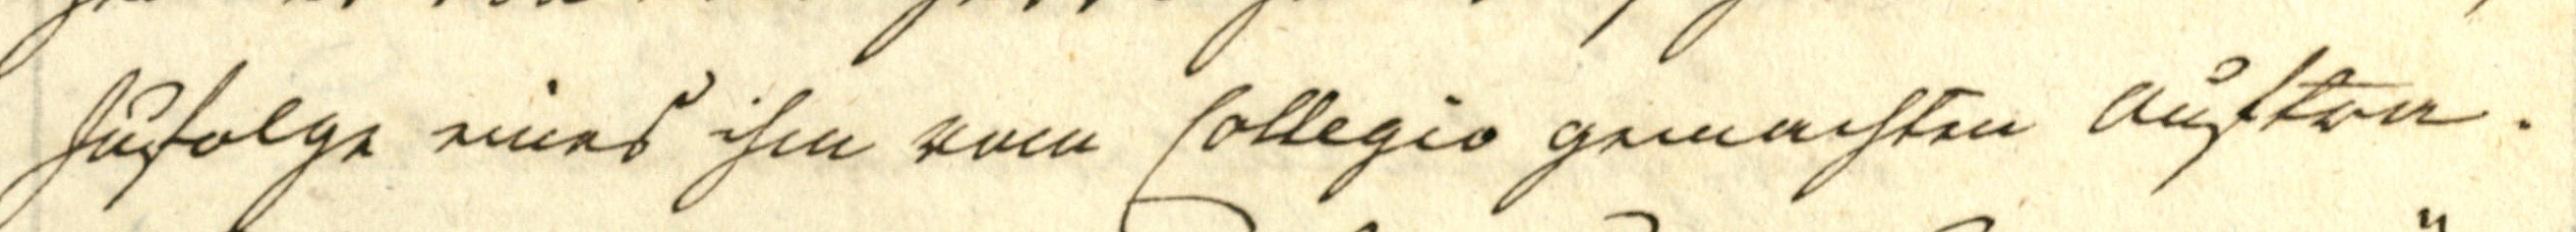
zufolge eines ihm vom Collegio gemachten Auftra¬
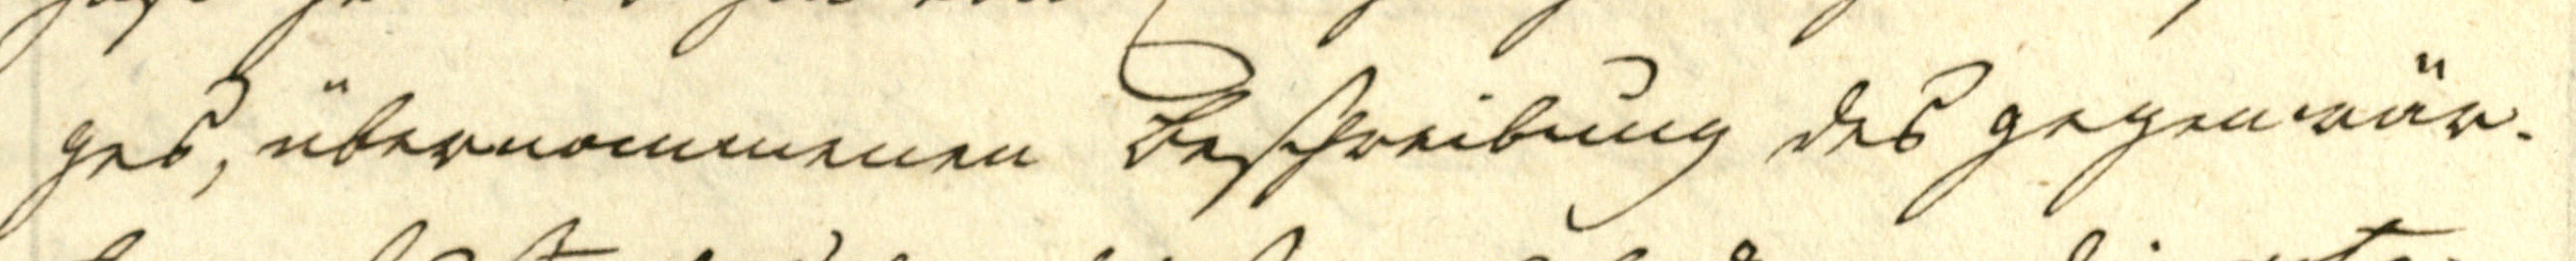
des, übernommenen Beschreibung des gegenwär¬
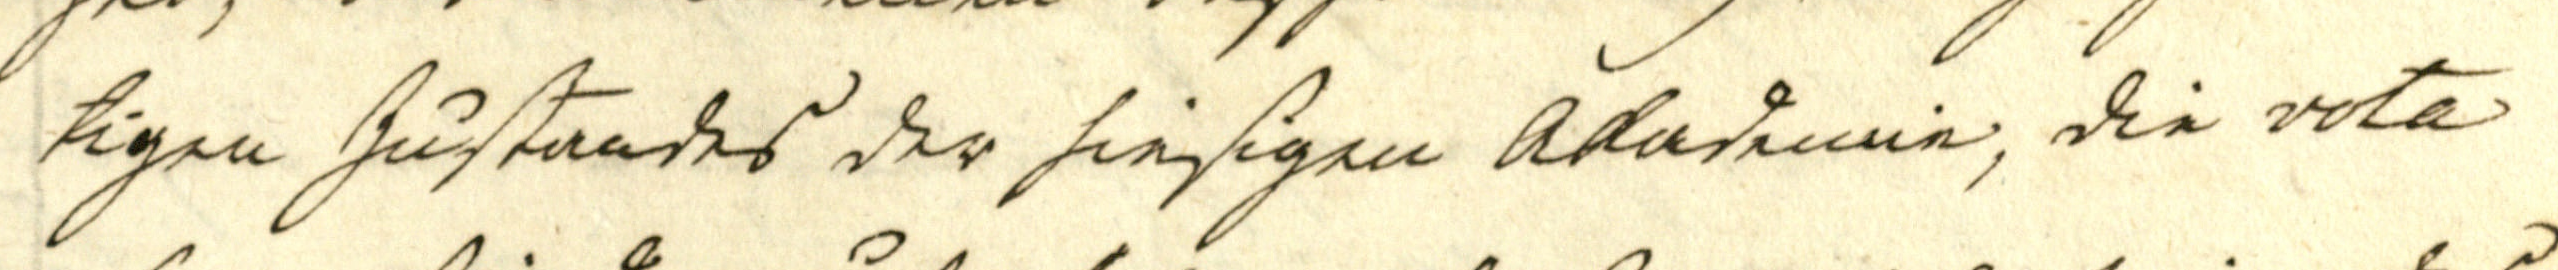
tigen Zustandes der hiesigen Akademie, die vota
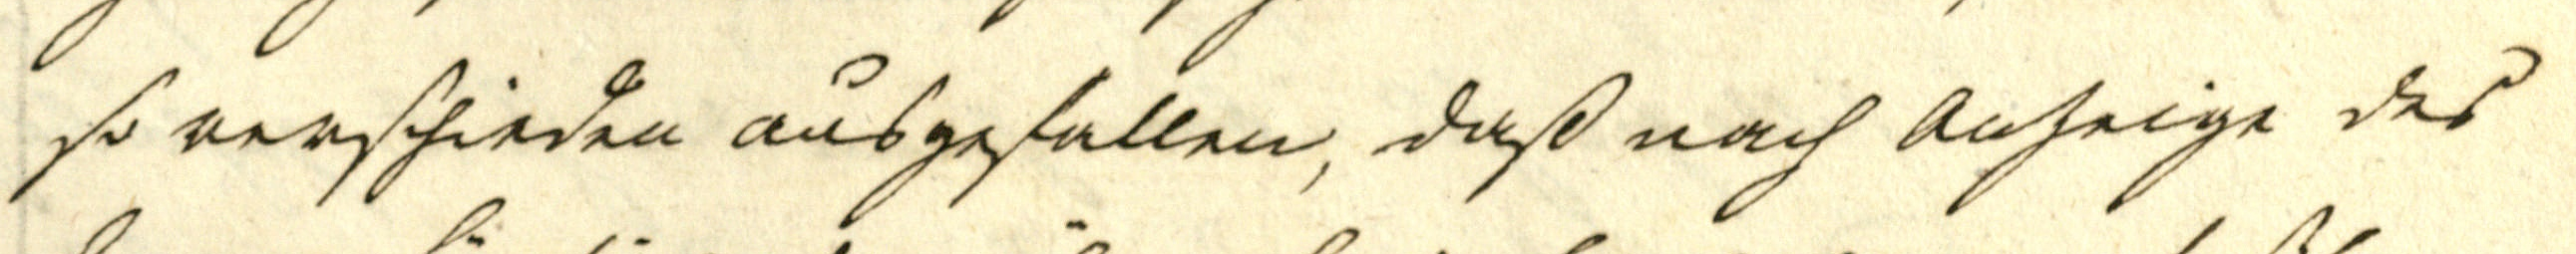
so verschieden ausgefallen, daß nach Anzeige des
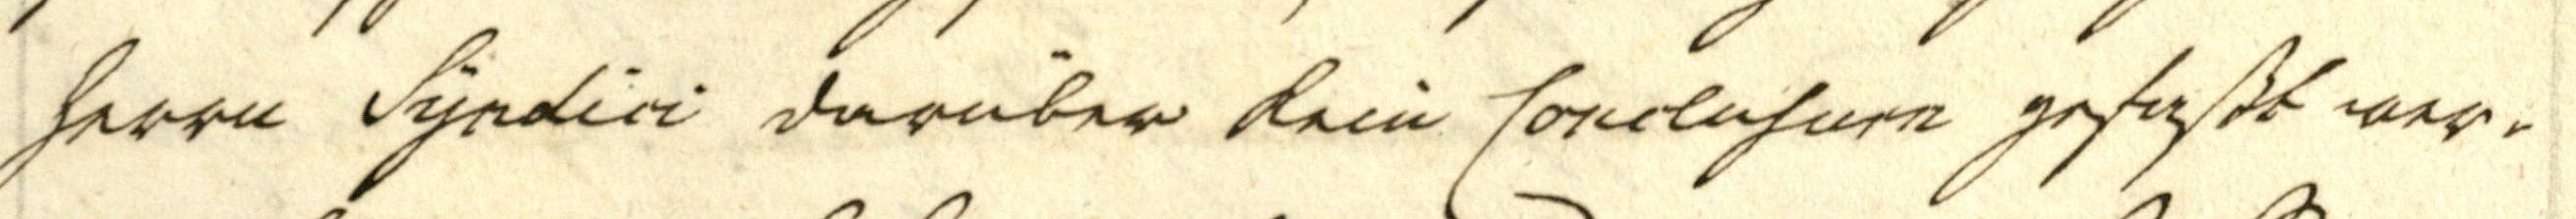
Herrn Sÿndici darüber kein Conclusum gefaßt wer¬
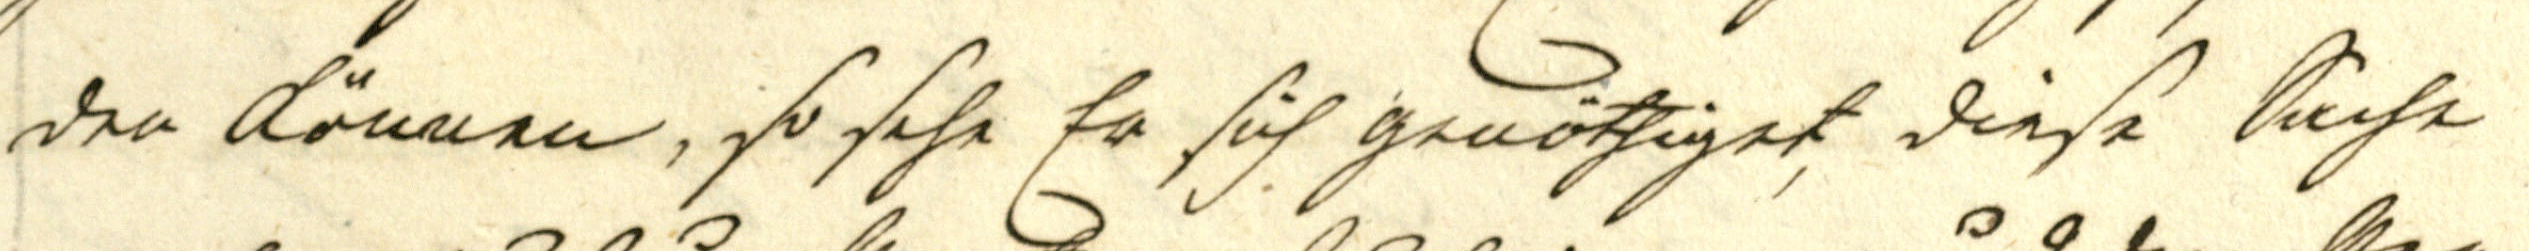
den können, so sehr Er sich genöthiget, diese Sache
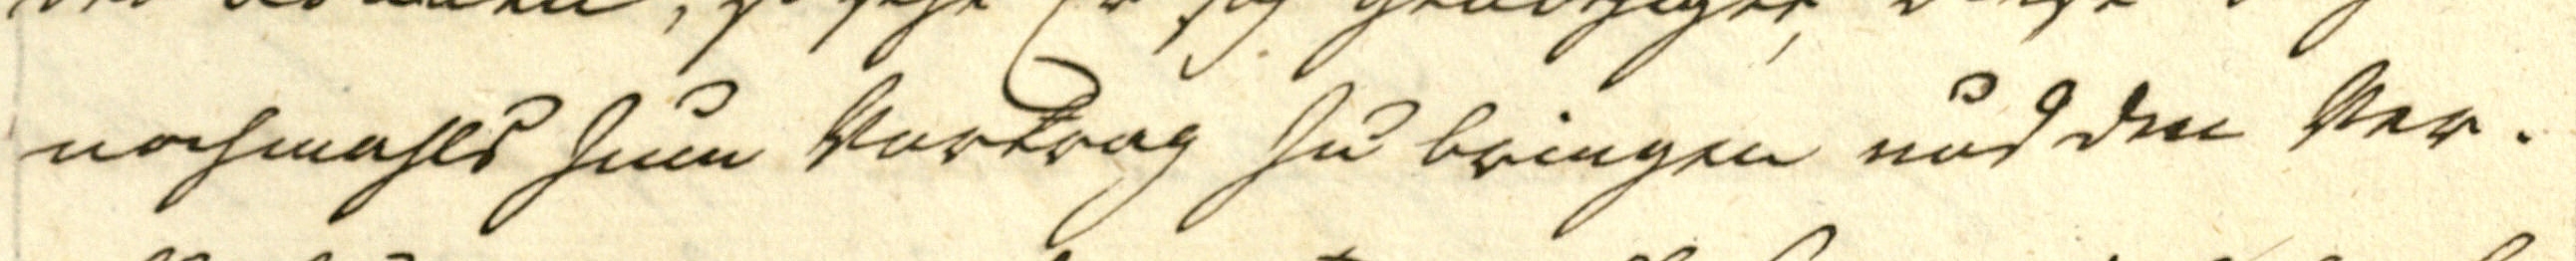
nochmahls zum Vortrag zu bringen und den Ver¬
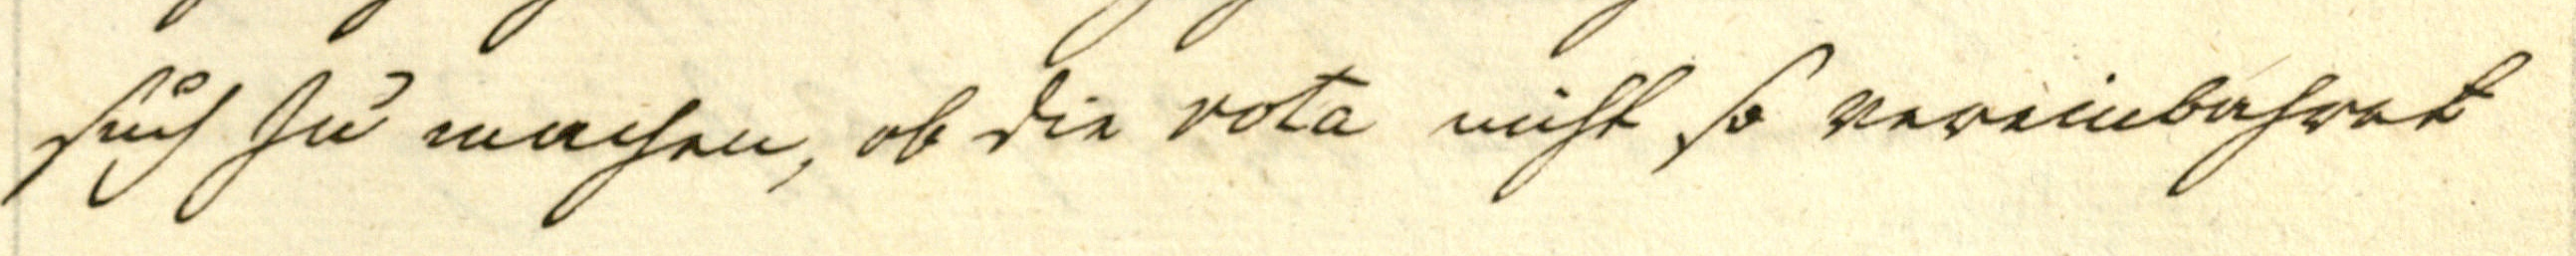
such zu machen, ob die vota nicht so vereinbahret
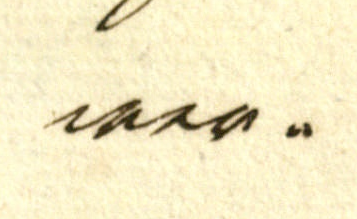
wer¬
